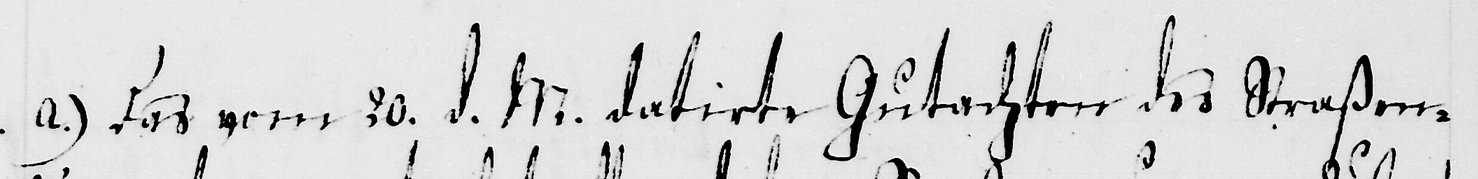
a.) Das vom 20. d. M. datirte Gutachten des Straßen-D¬
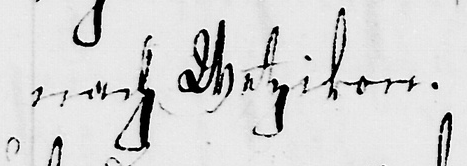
nach Wetzikon.
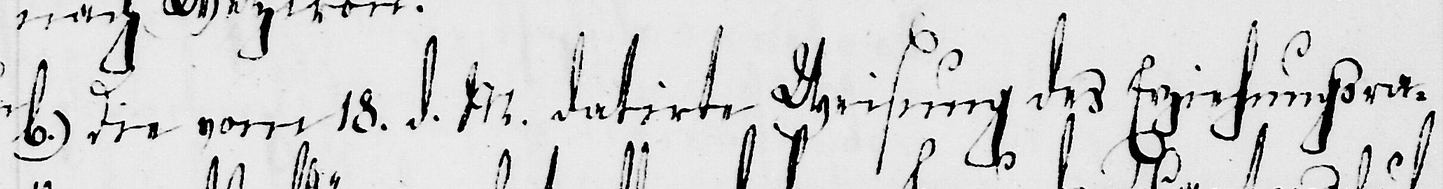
b.) Die vom 18. d. M. datirte Weisung des Erziehungsra¬
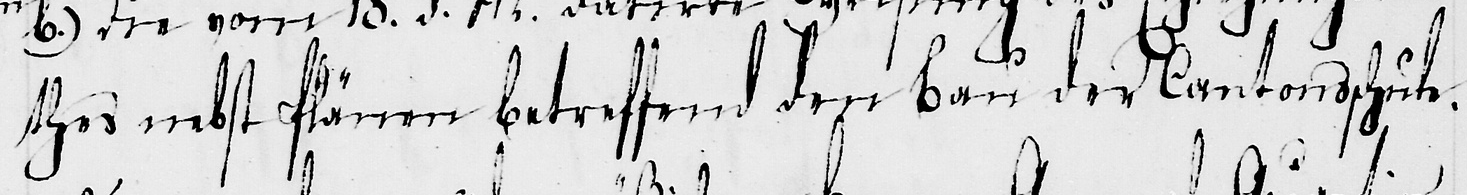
thes nebst Plänen betreffend den Bau der Cantonsschul¬
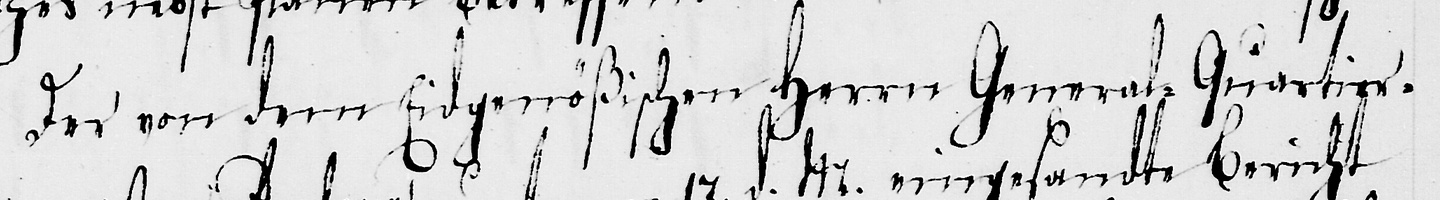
Der von dem Eidgenößischen Herrn General-Quartier¬
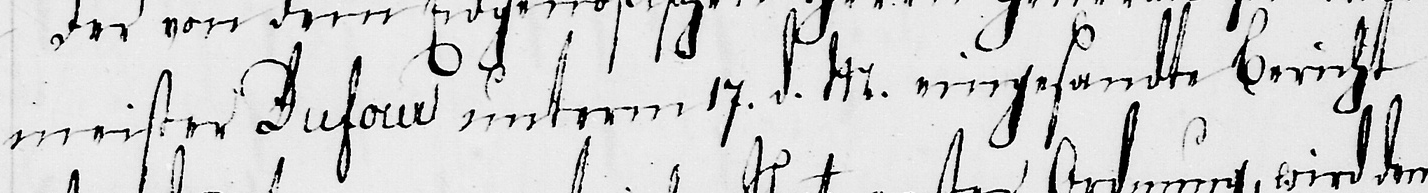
meister Dufour unterm 17. d. M. eingesandte Bericht
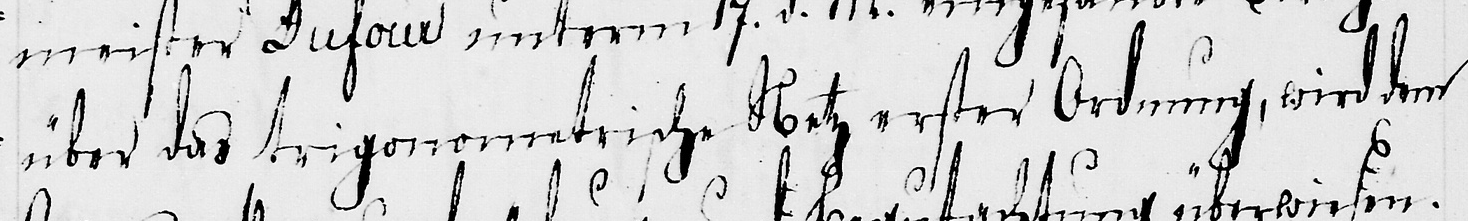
über das trigonometrische Netz erster Ordnung, wird dem
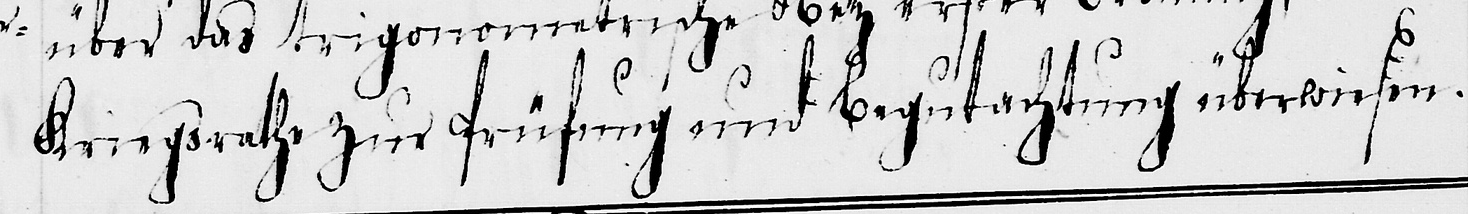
Kriegsrathe zur Prüfung und Begutachtung überwiesen.
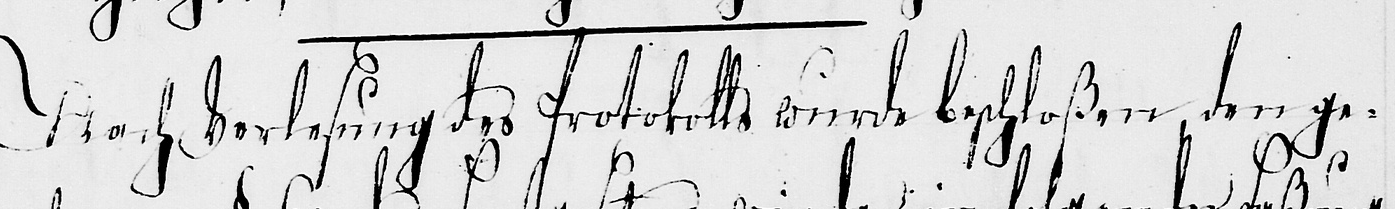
esung des Protokolls wurde beschloßen, den ge¬
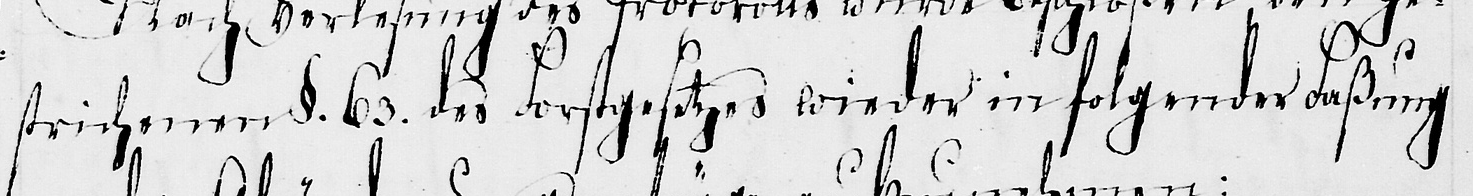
strichenen §. 63. des Forstgesetzes wieder in folgender Faßung
